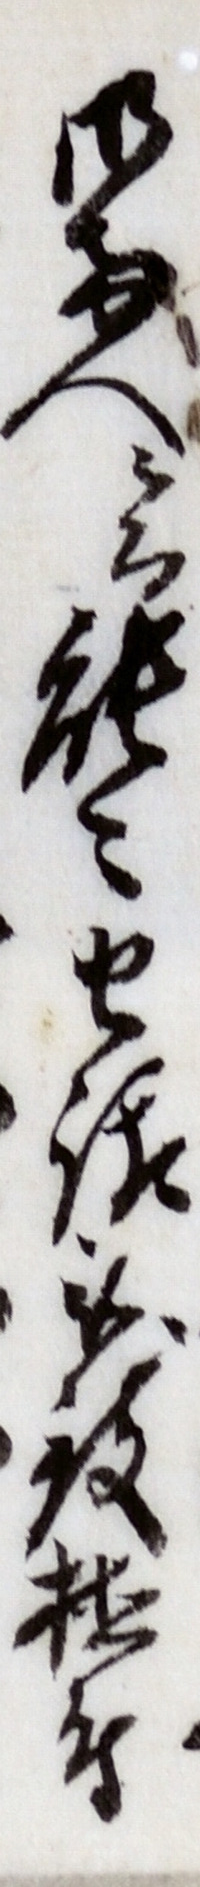御両人にて能々世話被致植付
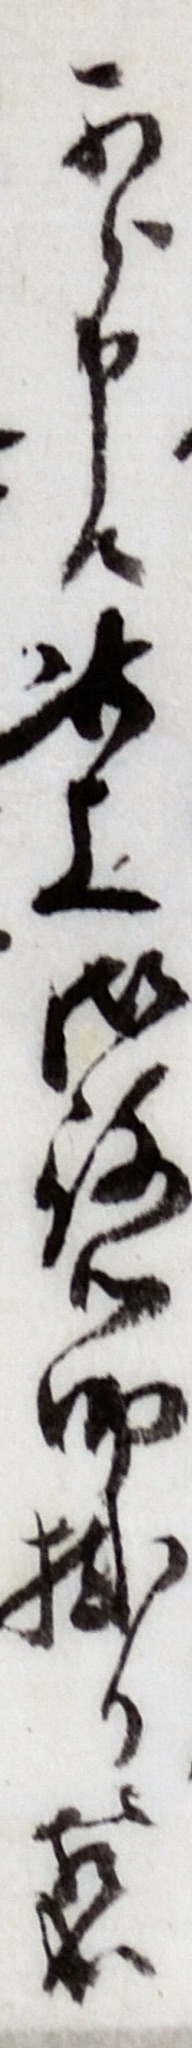可被申候此上御役筋掛りに相成
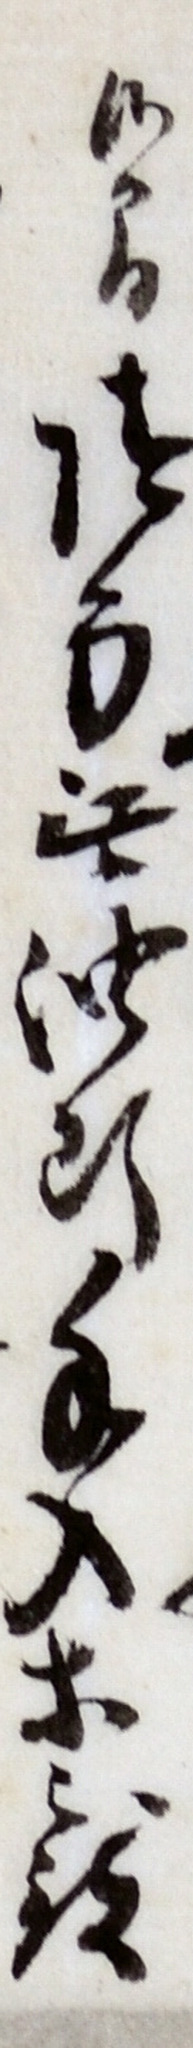候間請方無油断手入等被致
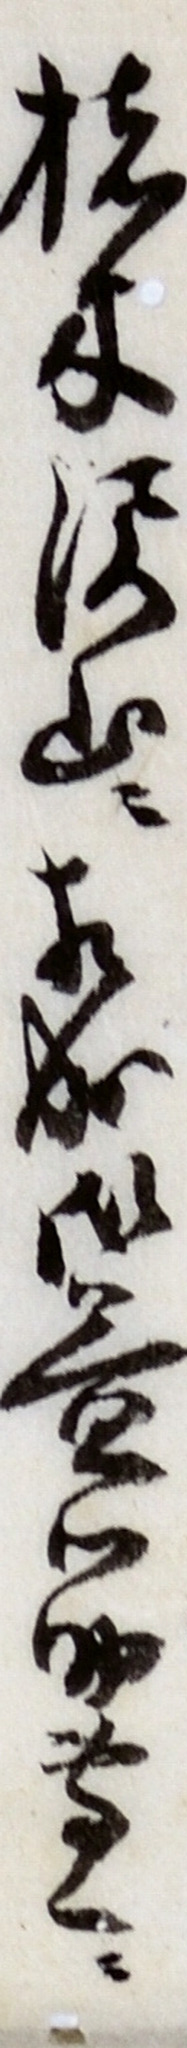楮木沢山に相成御益筋専一に
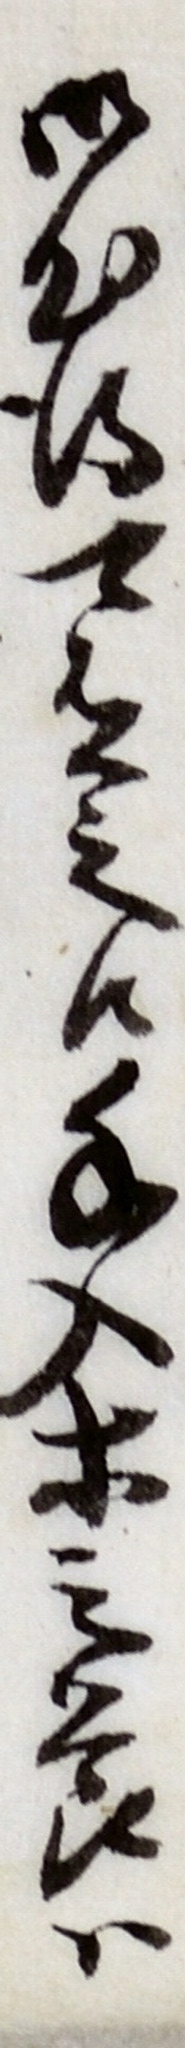御心得可有之候手入等之節は
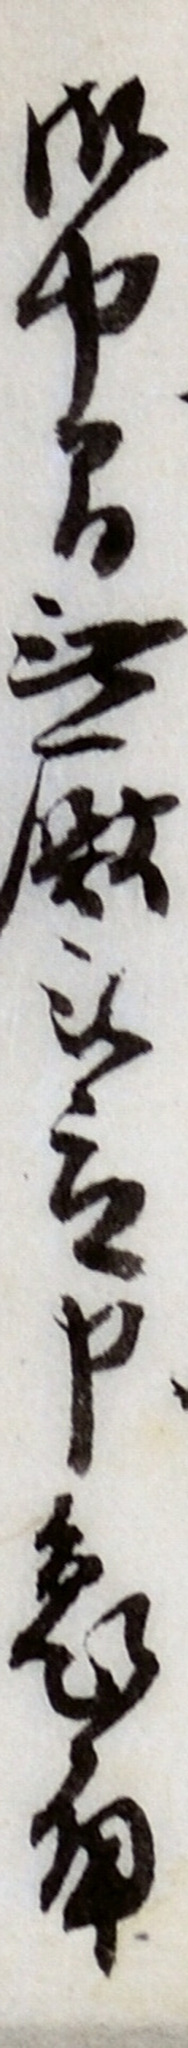御中間無厭被立申兎角
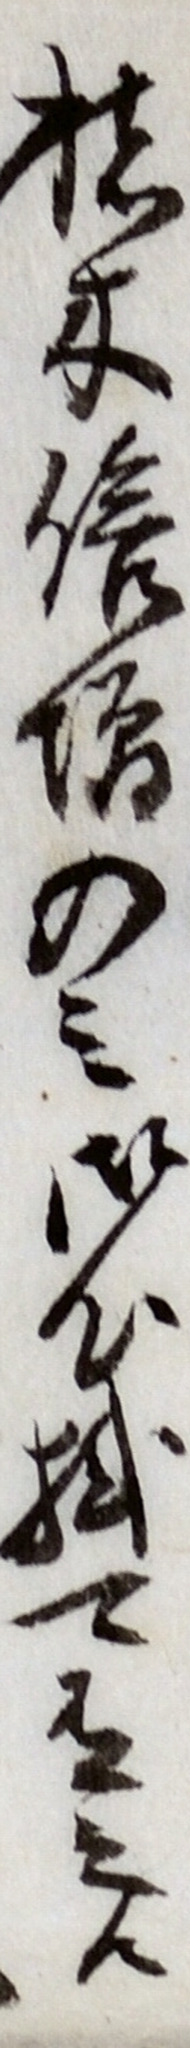楮木倍増のみ御心掛可有之候
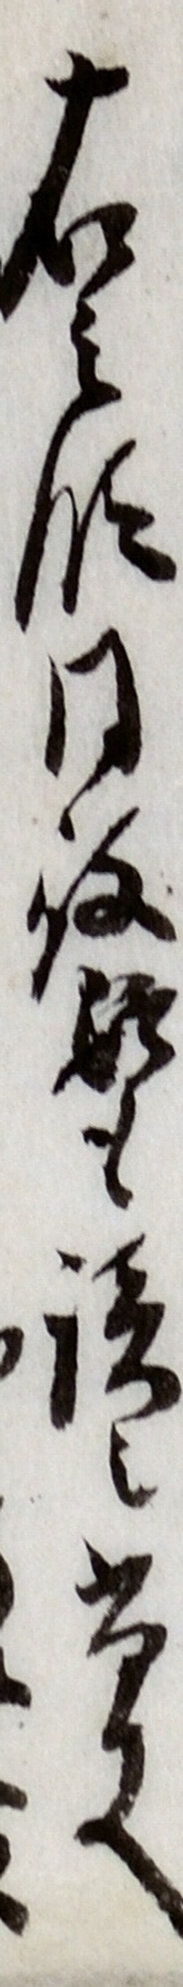右之段同役えも談し尚又
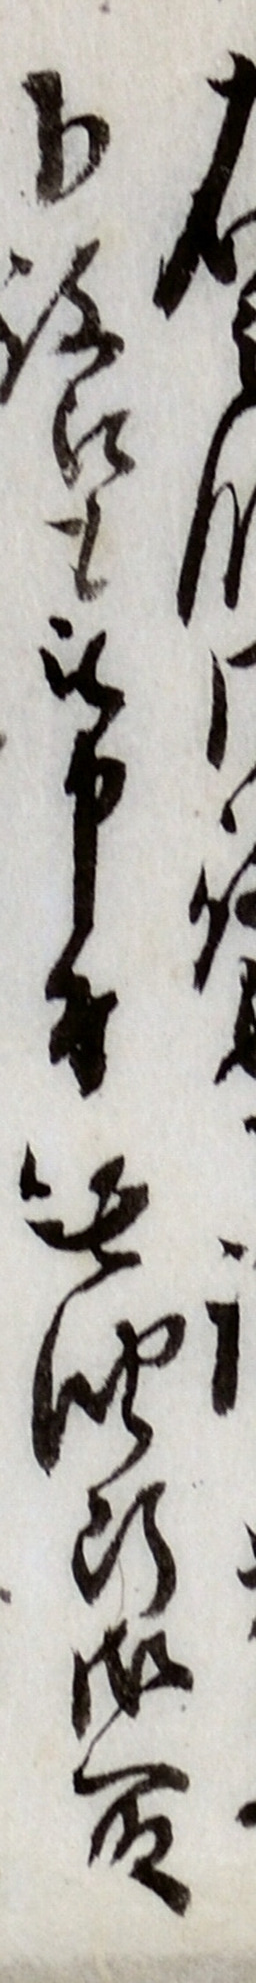下役えも被申付無油断御取
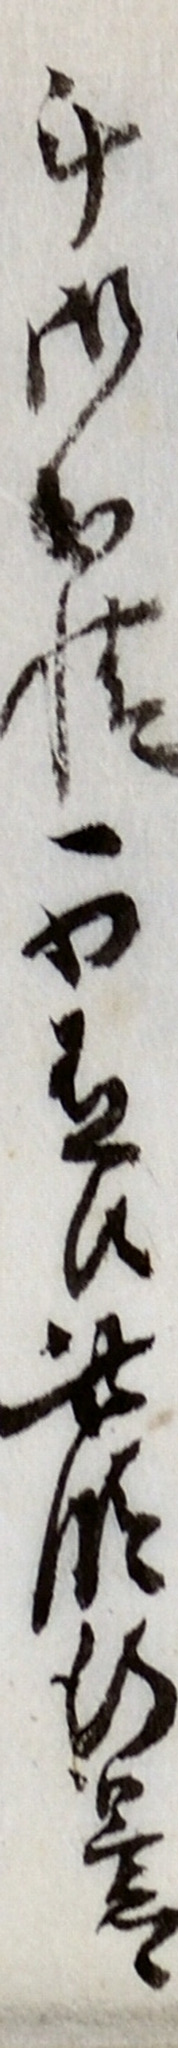計御出情可有候此段得御意候
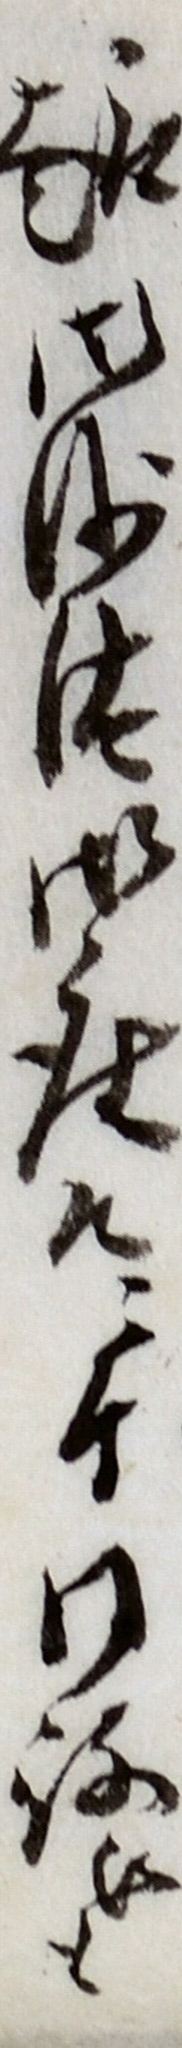趣御沙汰御座候に付同役えも
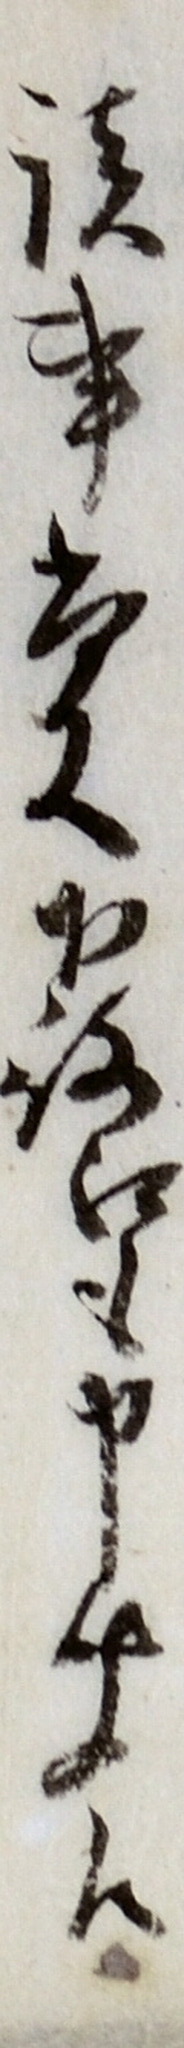諸事尚又下役えも申聞候
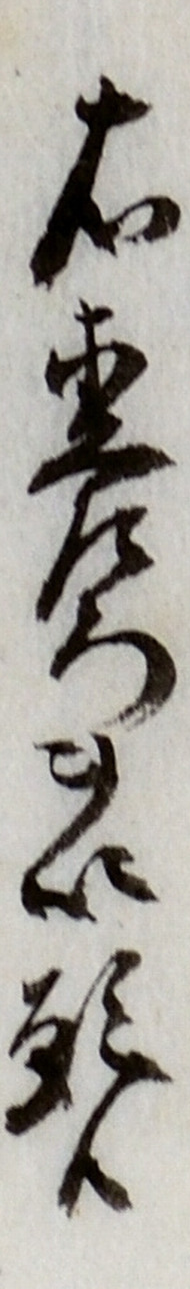右杢左衛門を以願候
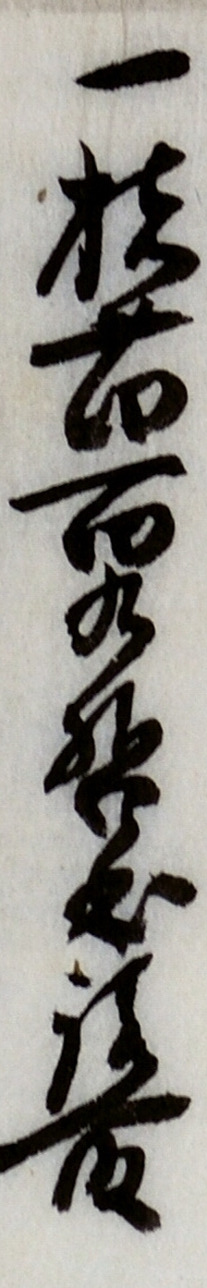一楮苗百九拾四本請取
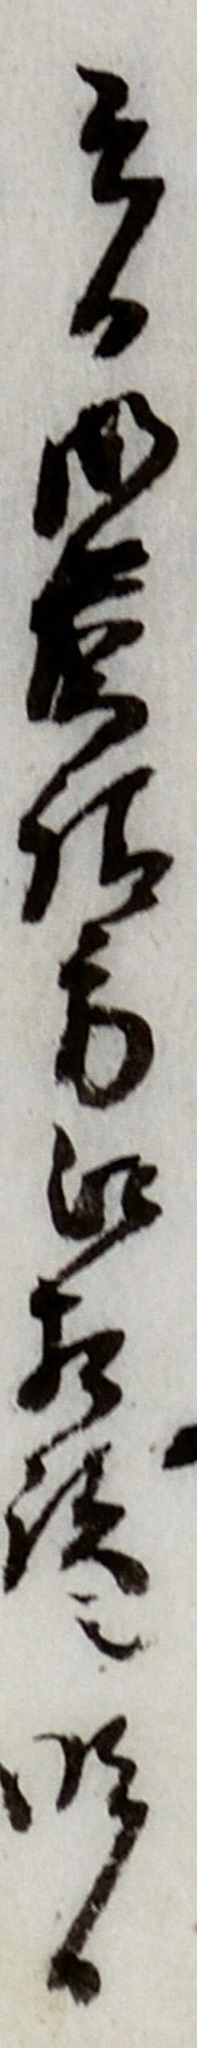今日御普請方え相談し明日
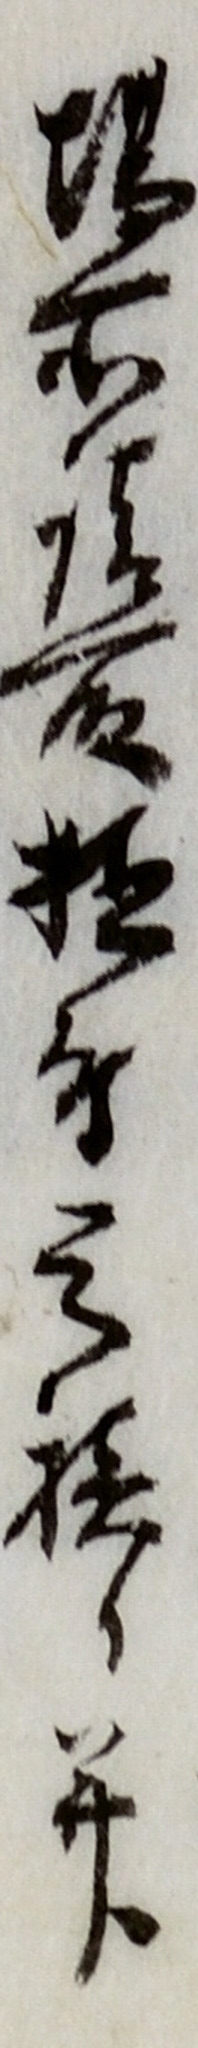場所請取植付之積り并
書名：諸事御用留帳
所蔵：伊那市立高遠町図書館・合同会社AMANE
